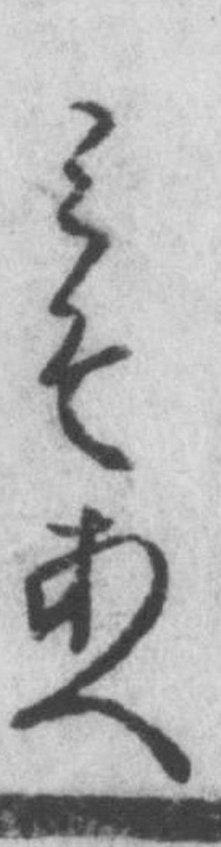みそあへ

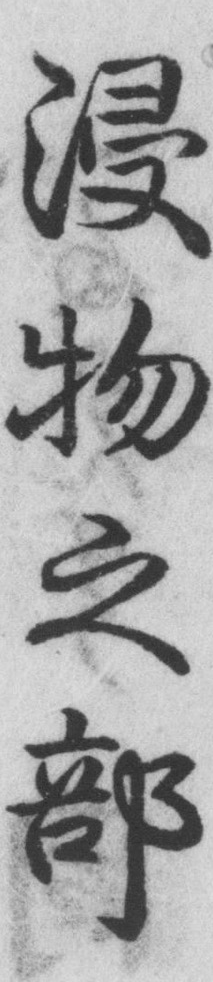浸物之部
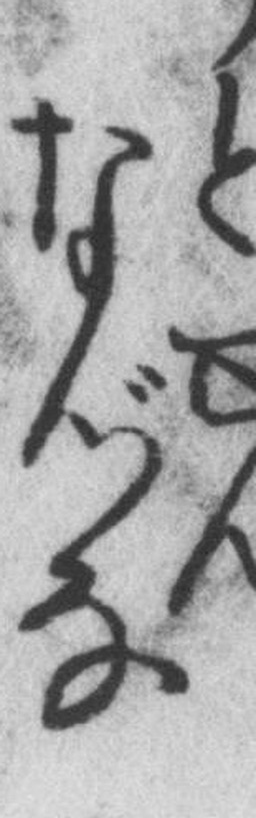なづな
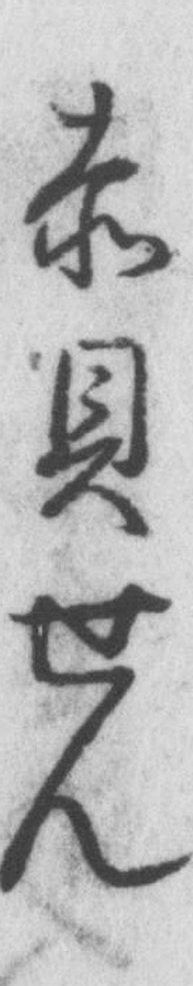赤貝せん
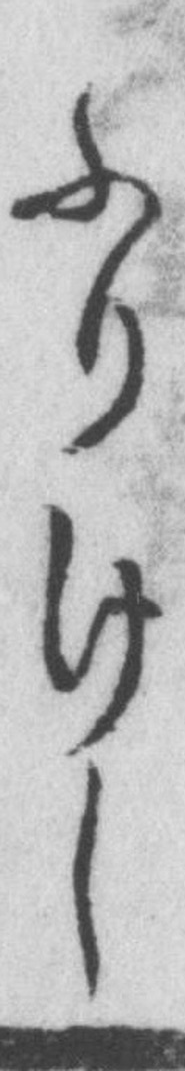ふりけし
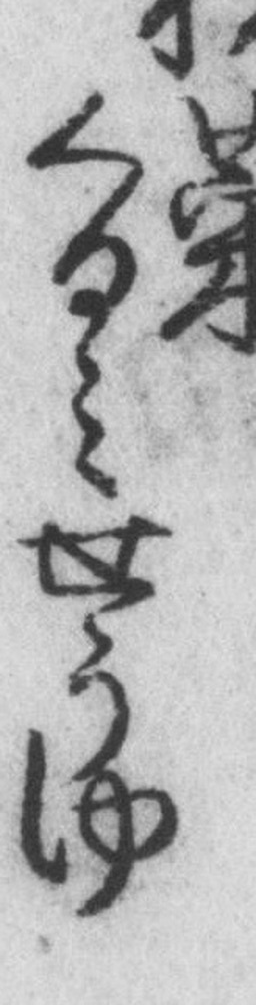くるみせうゆ
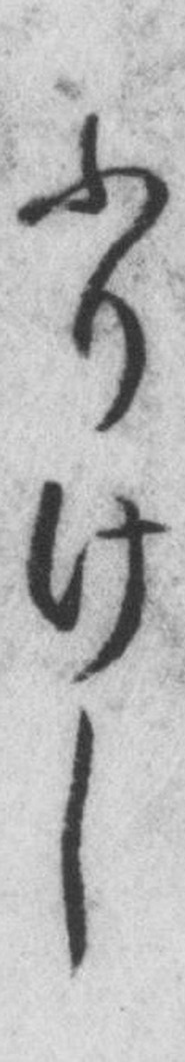ふりけし

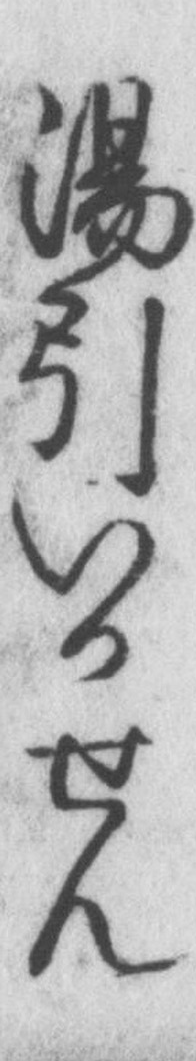湯引いかせん
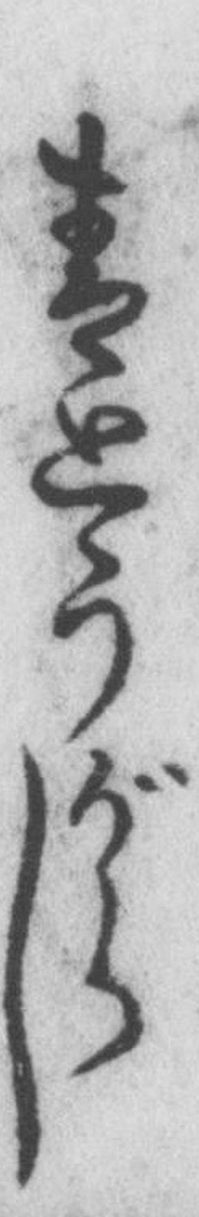青とうがらし
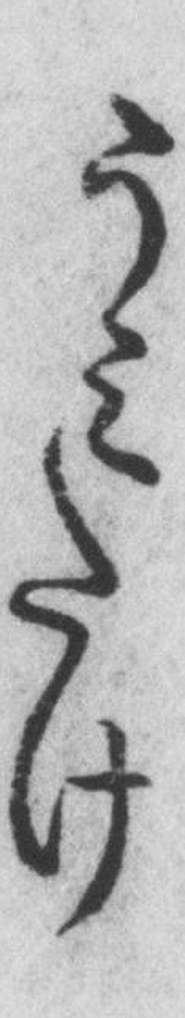うみたけ

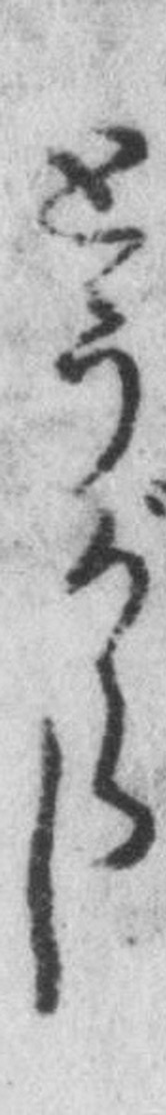とうがらし
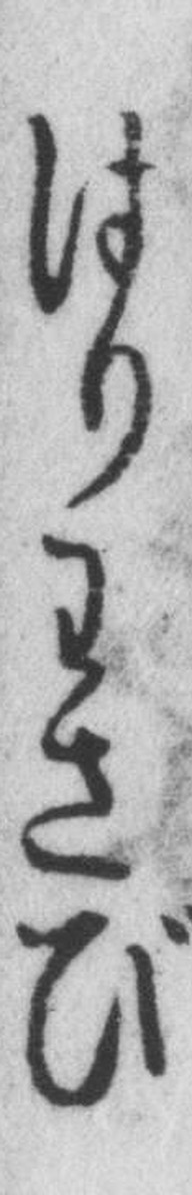はりわさび
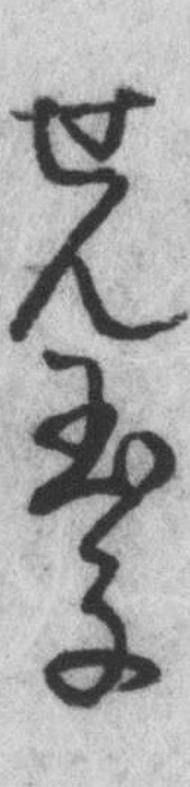せん玉子

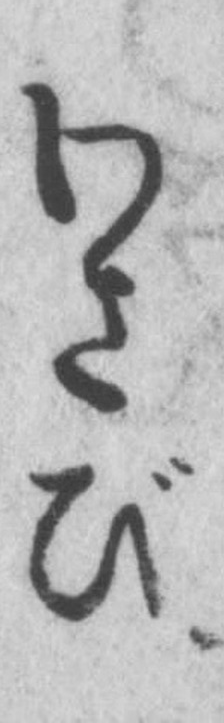わさび
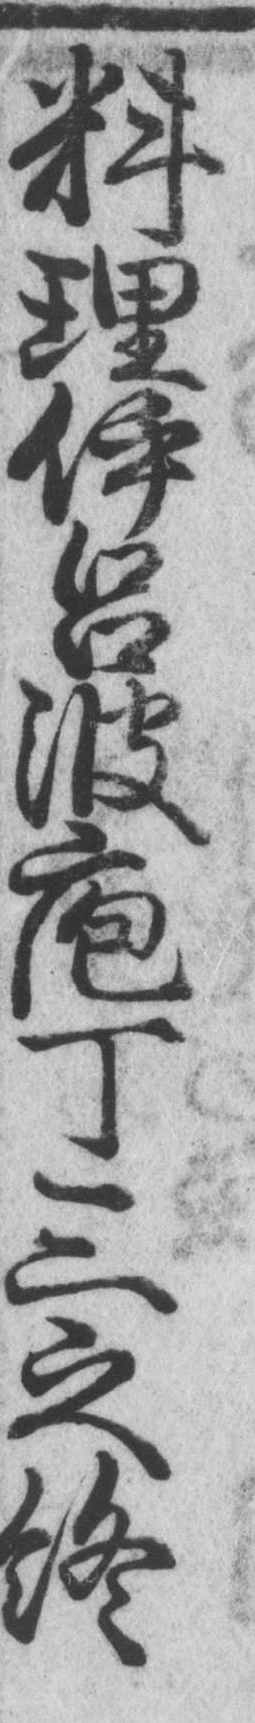料理伊呂波庖丁三之終

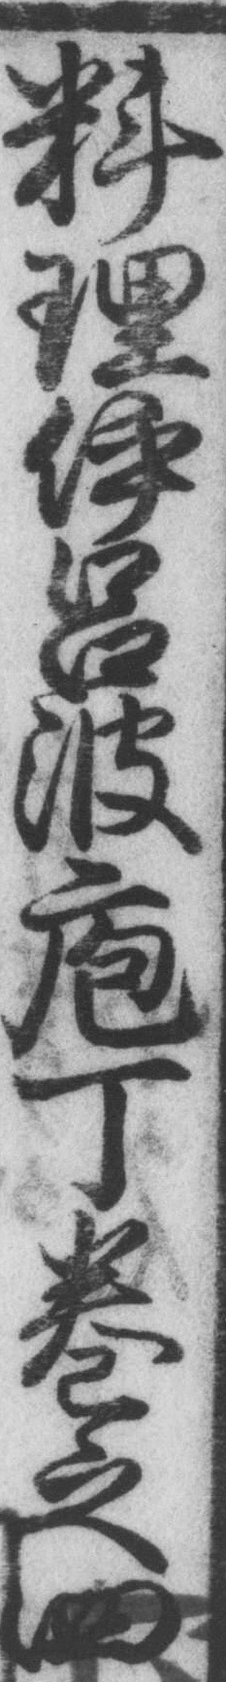料理伊呂波庖丁巻之四
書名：料理伊呂波庖丁
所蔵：大阪府立大学学術情報センター 国文学研究資料館
